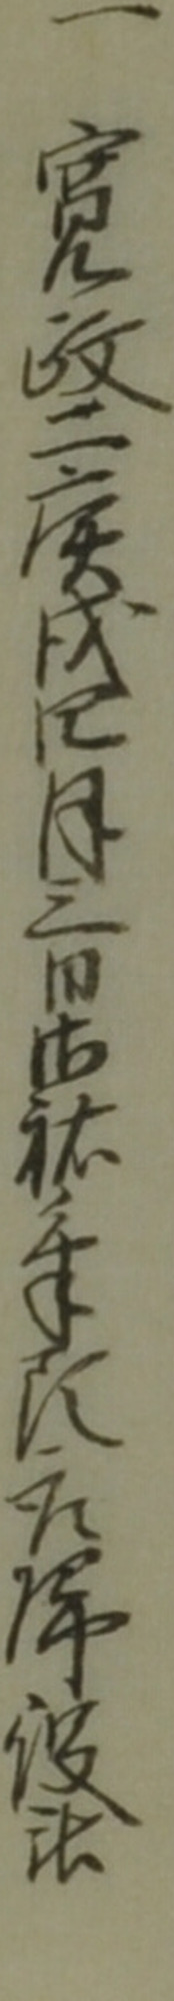一寛政二庚戌四月三日御祐筆頭取席役被
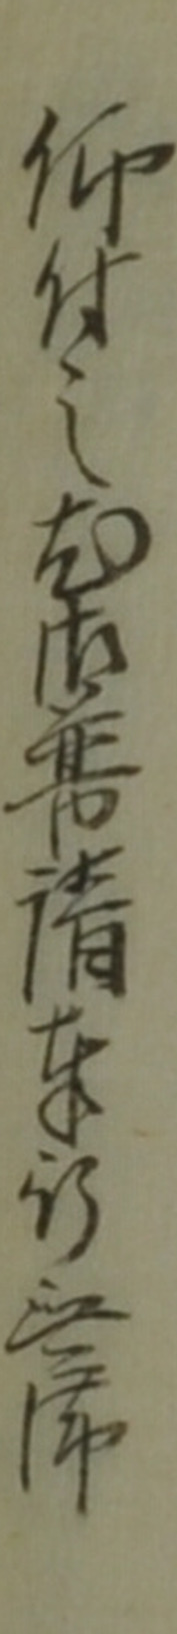仰付之尤御番普請奉行無滞
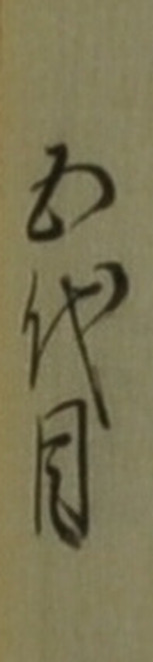五代目
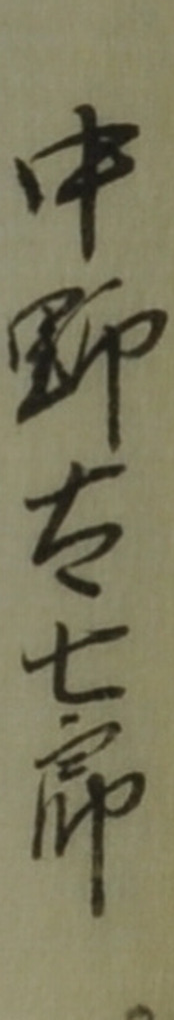中野太七郎
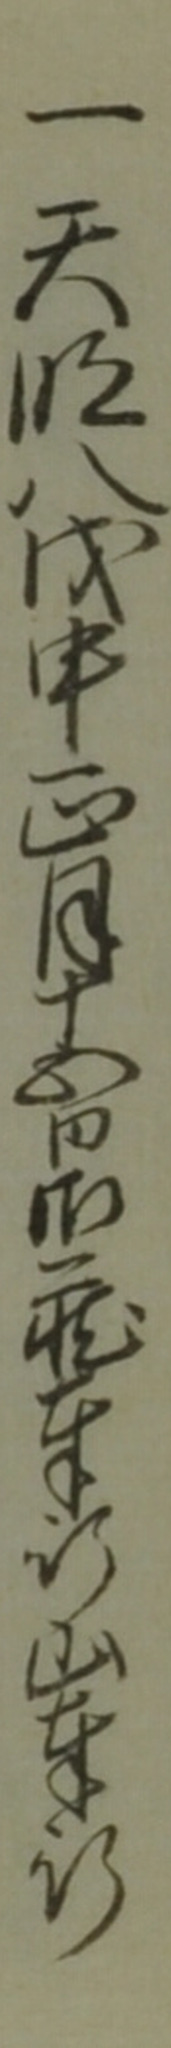一天明八戊申正月十五日御蔵奉行山奉行
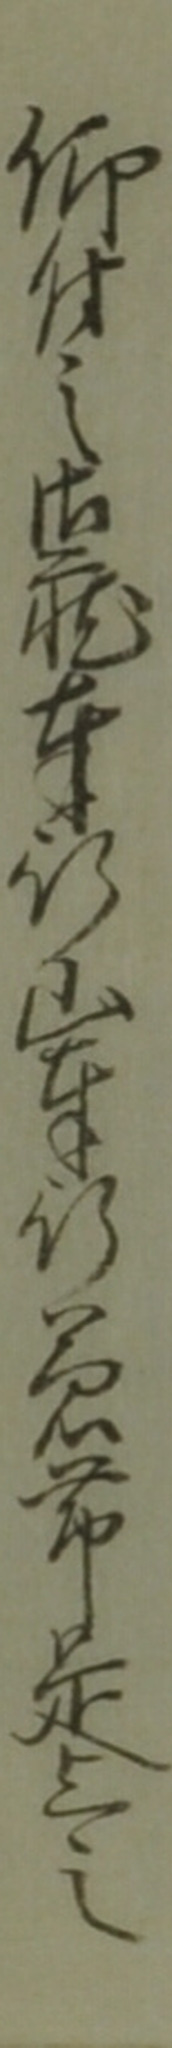仰付之御蔵奉行山奉行兼帯是迄之
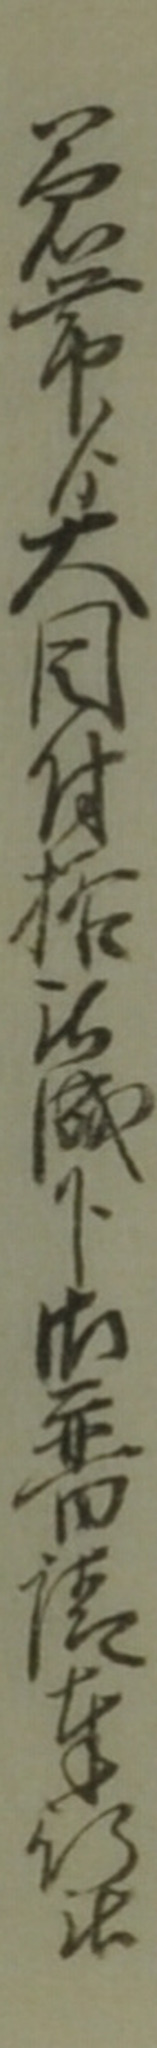兼帯ゟ大目付格被成下御普請奉行被
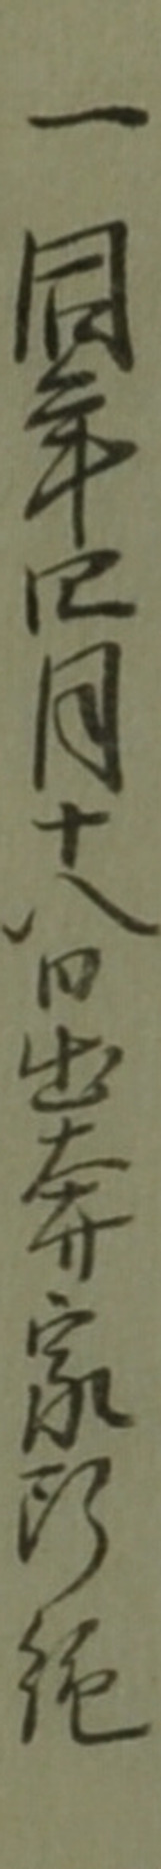一同年四月十八日出奔家断絶
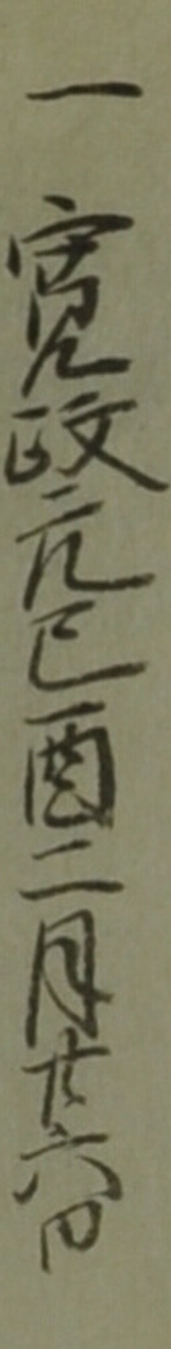一寛政元己酉二月廿六日
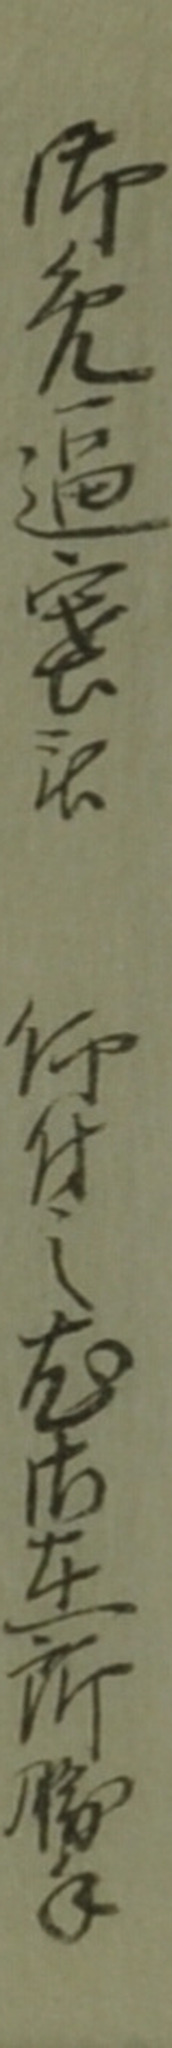御免逼塞被仰付之尤御在所勝手
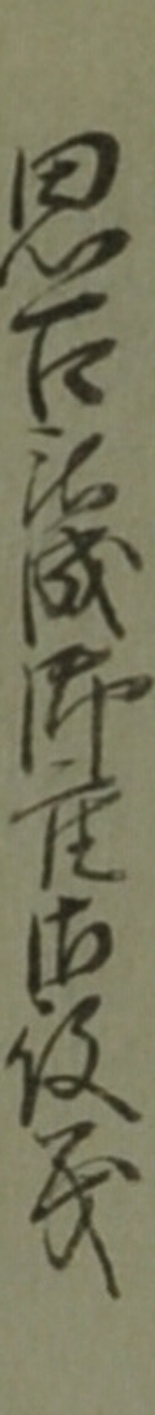思召被成立御座御役義
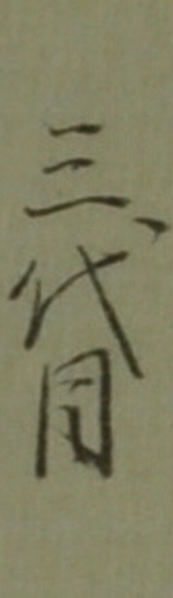三代目
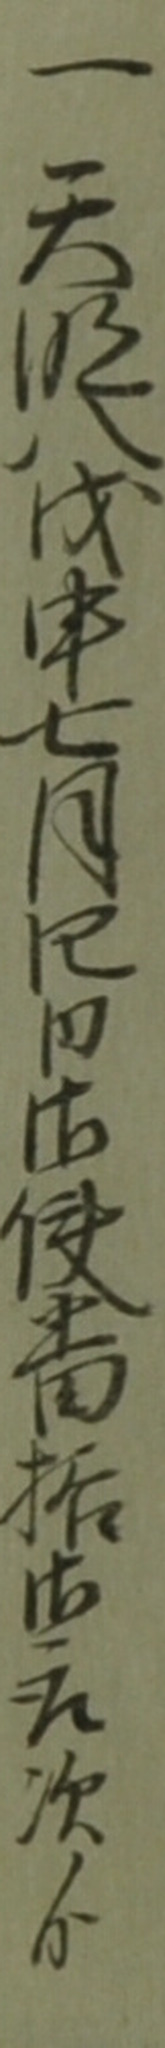一天明八戊申七月四日御使番格御取次ゟ
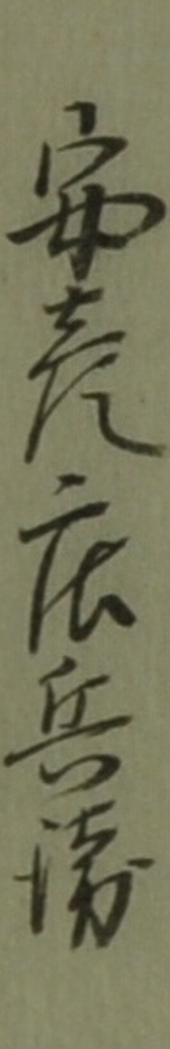安彦庄兵衛
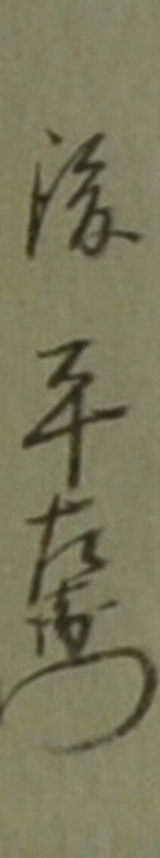後平左衛門
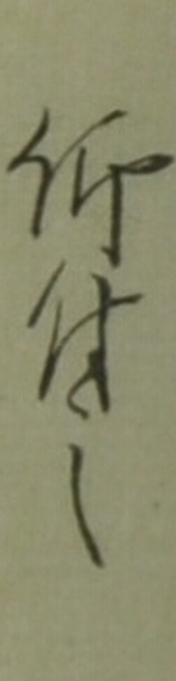仰付之
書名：諸御役代々録（六）
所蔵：伊那市立高遠町図書館・合同会社AMANE
